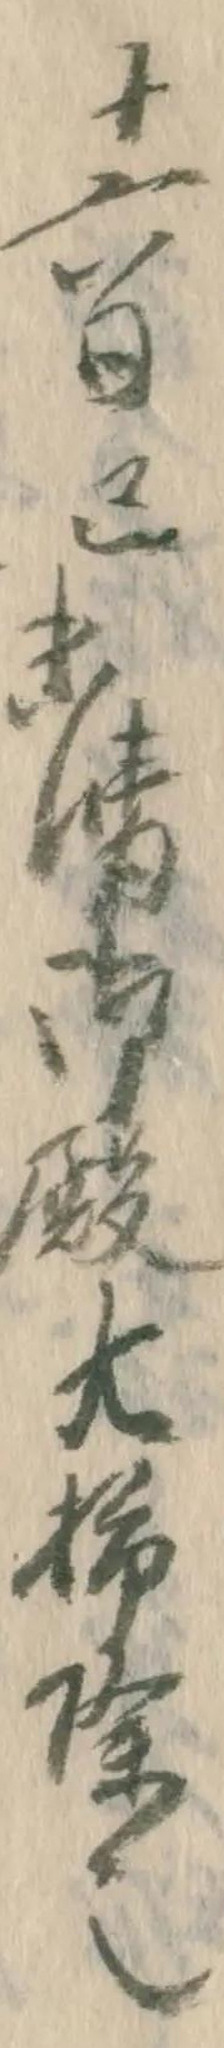十六日己未晴御殿大掃除也
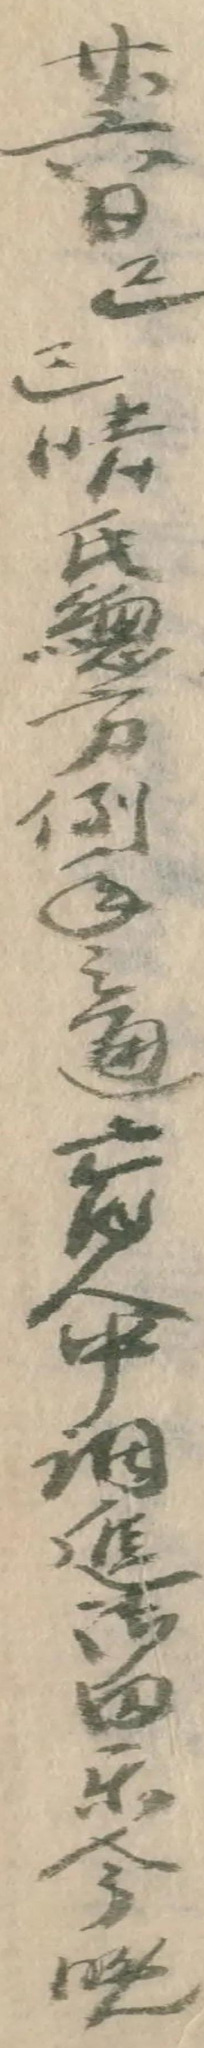廿六日己巳晴民總万例年之通盲人中調進御田楽今晩

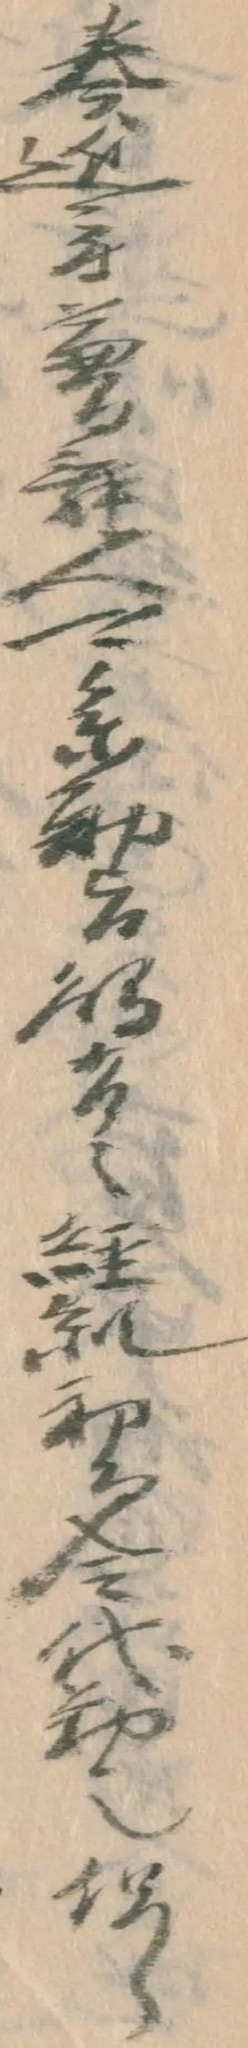奏近ニ付兼而舞人可参勤旨觸有之経紀初而令代勤也但し
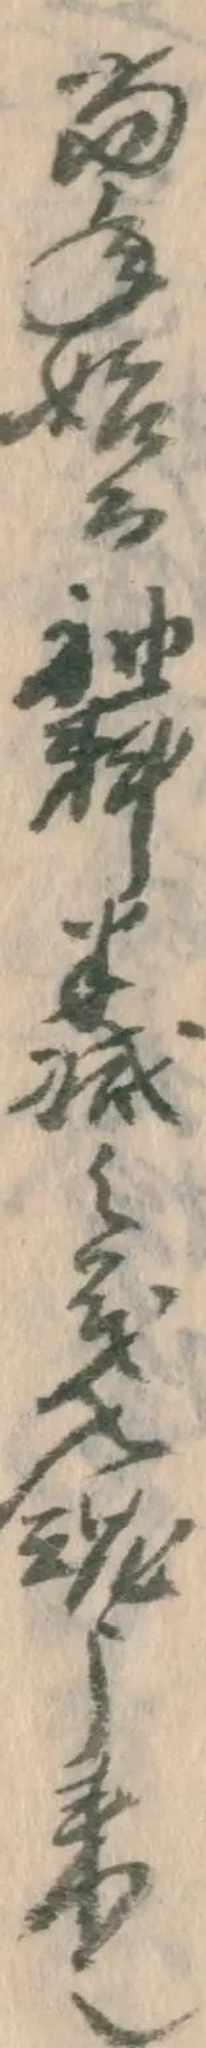當年始而袖料半減之義入魂申来之
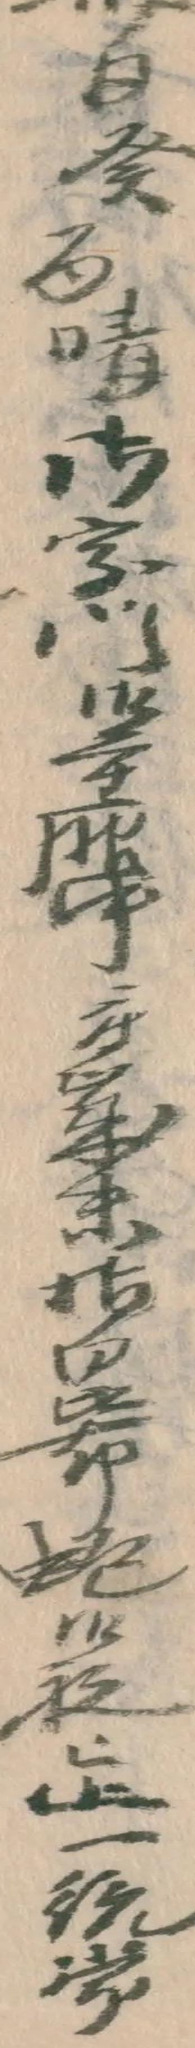卅日癸酉晴御家門御重服中ニ付歳末御昆布鮑御祝被止め一統常
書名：賀茂社記録. 第67冊
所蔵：国立国会図書館 National Diet Library, JAPAN
